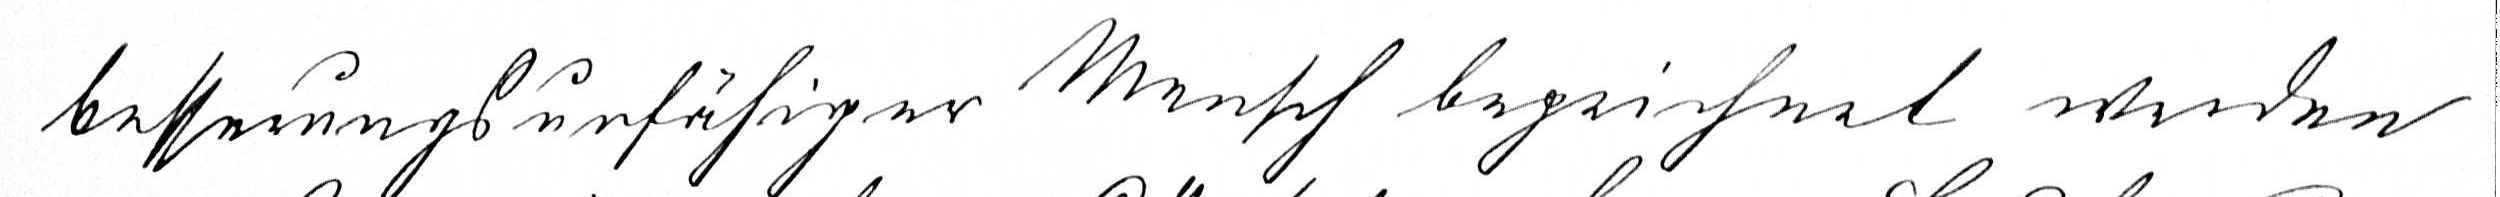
besserungsunfähiger Mensch bezeichnet werden
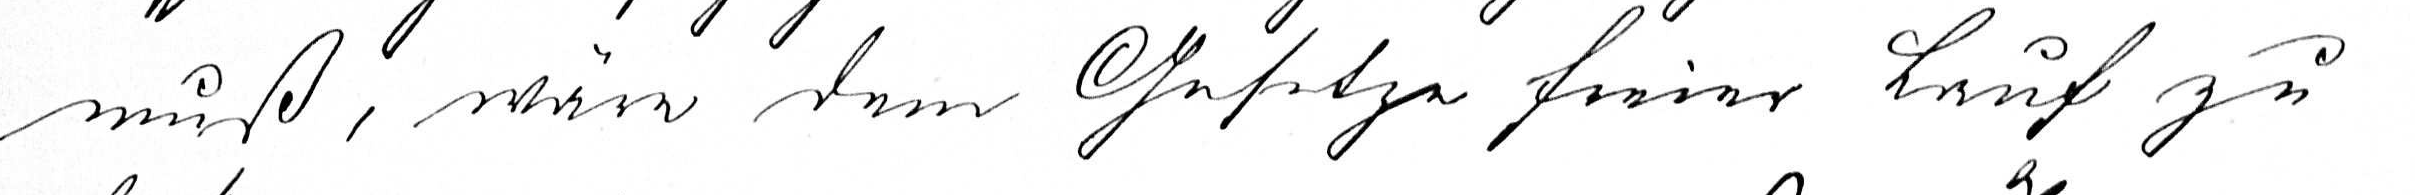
muß, wäre dem Gesetze freier Lauf zu
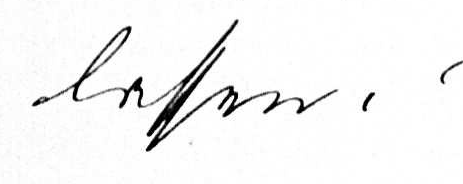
lassen.
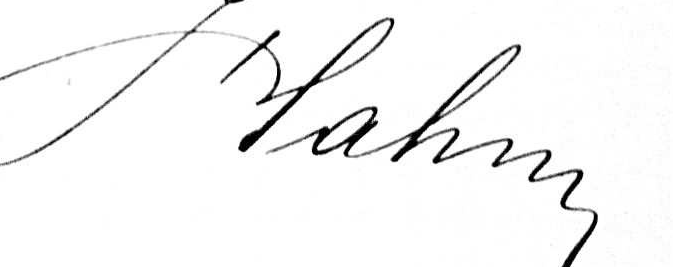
xxahm
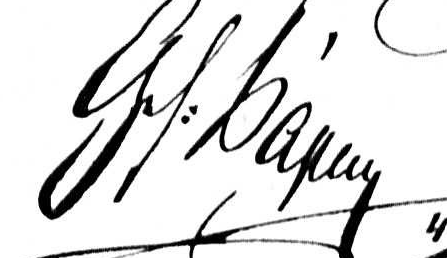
Ges: xx
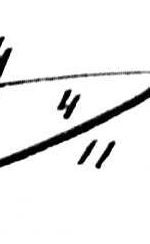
11/11
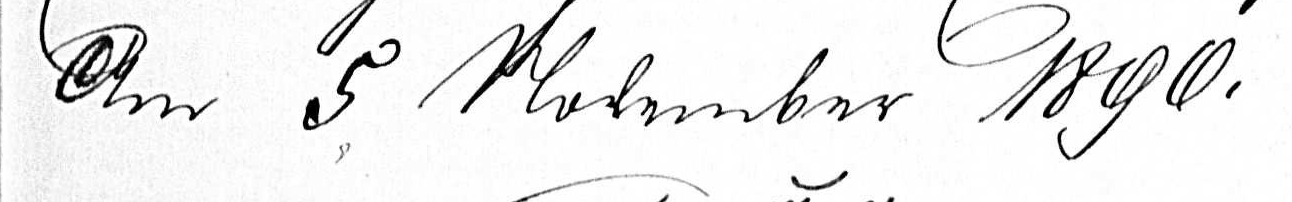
Am 5 November 1890
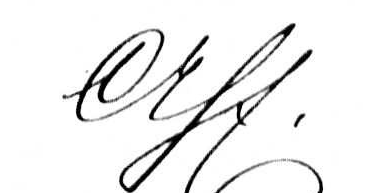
AhE.
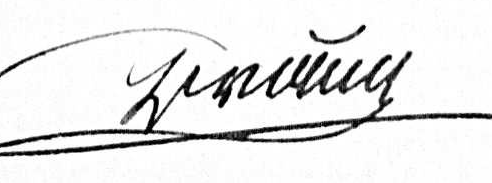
Braun
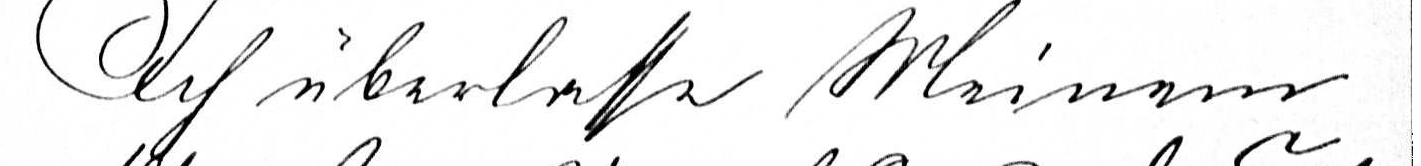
Ich überlasse Meinem
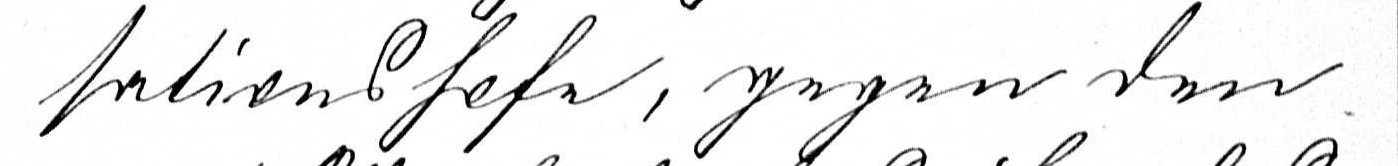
sationshofe, gegen den
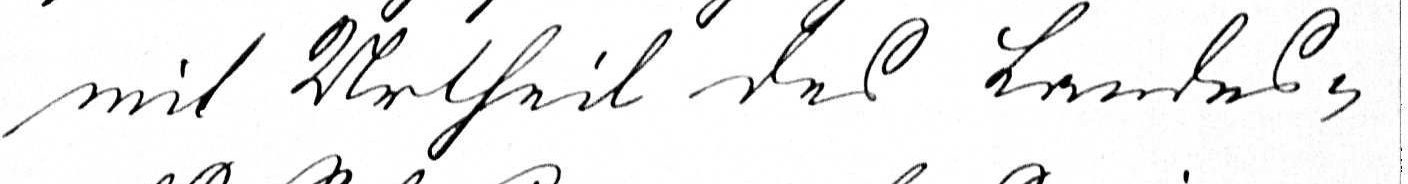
mit Urtheil des Landes¬
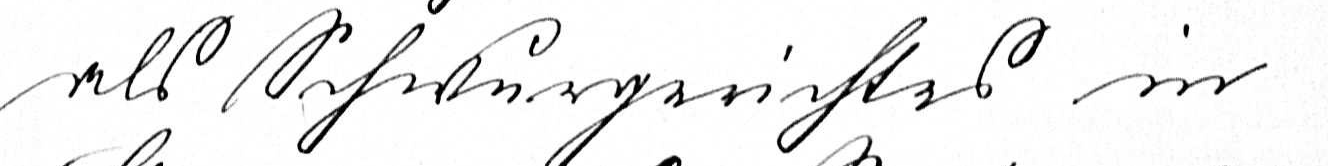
als Schwurgerichtes in
